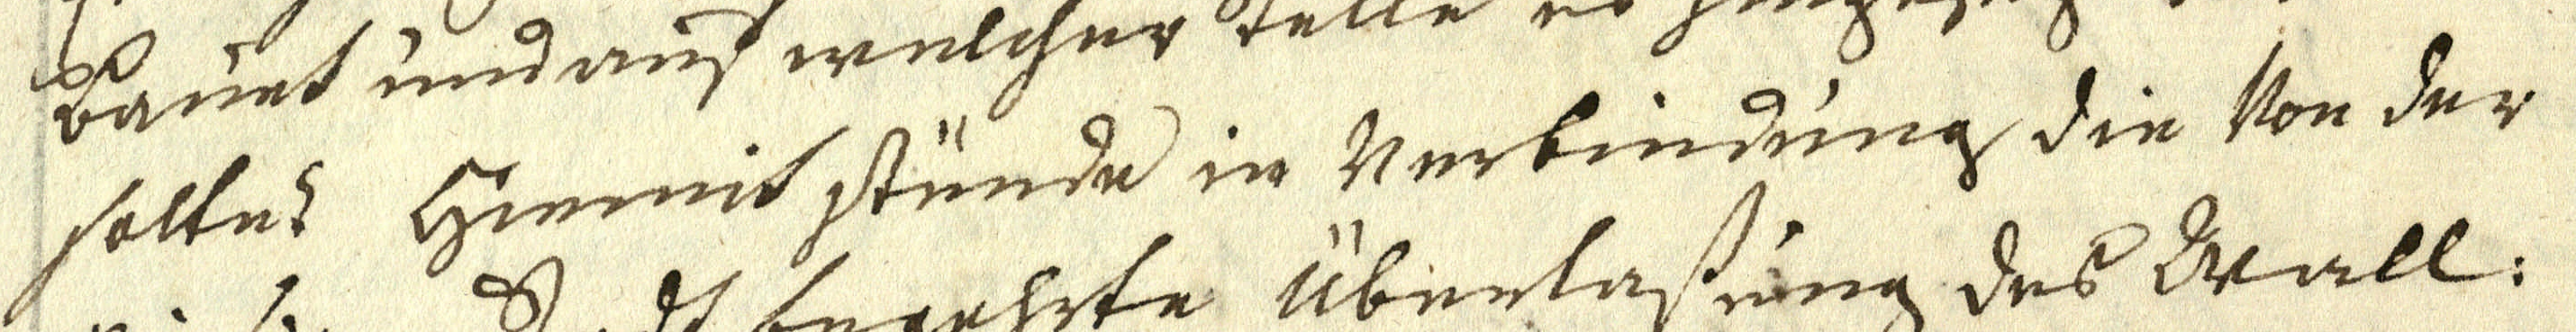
solte? Hiemit stünde in Verbindung die von der
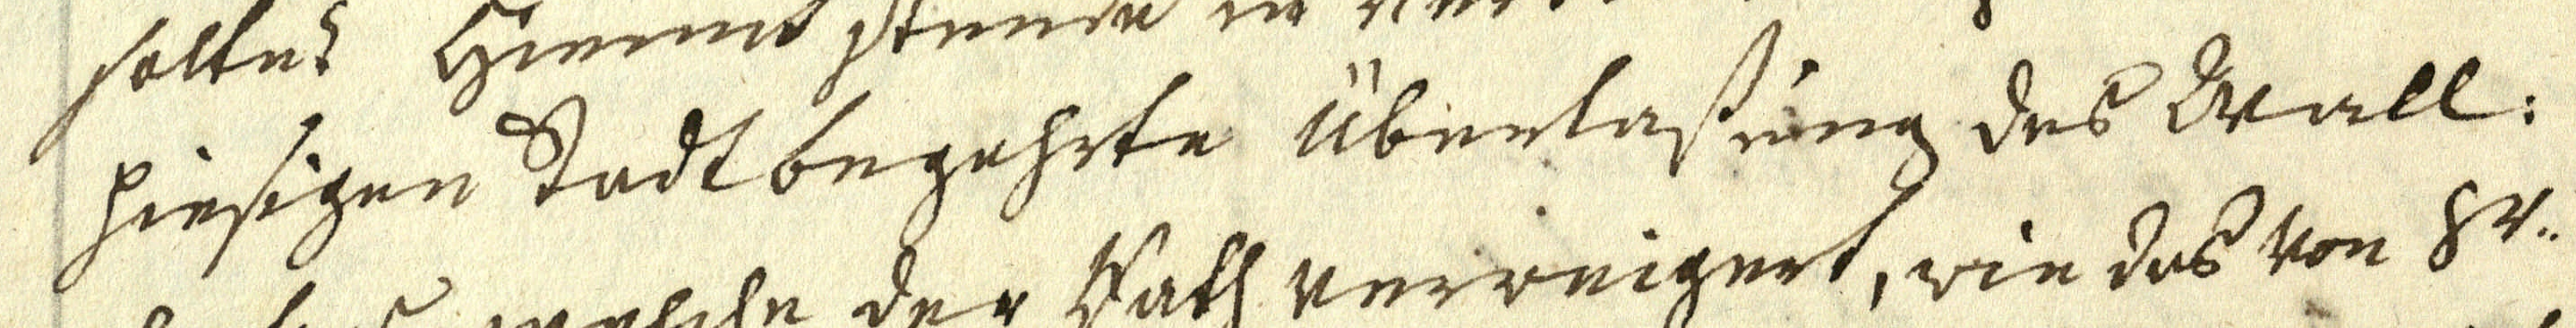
hiesigen Stadt begehrte Überlaßung des Wall¬
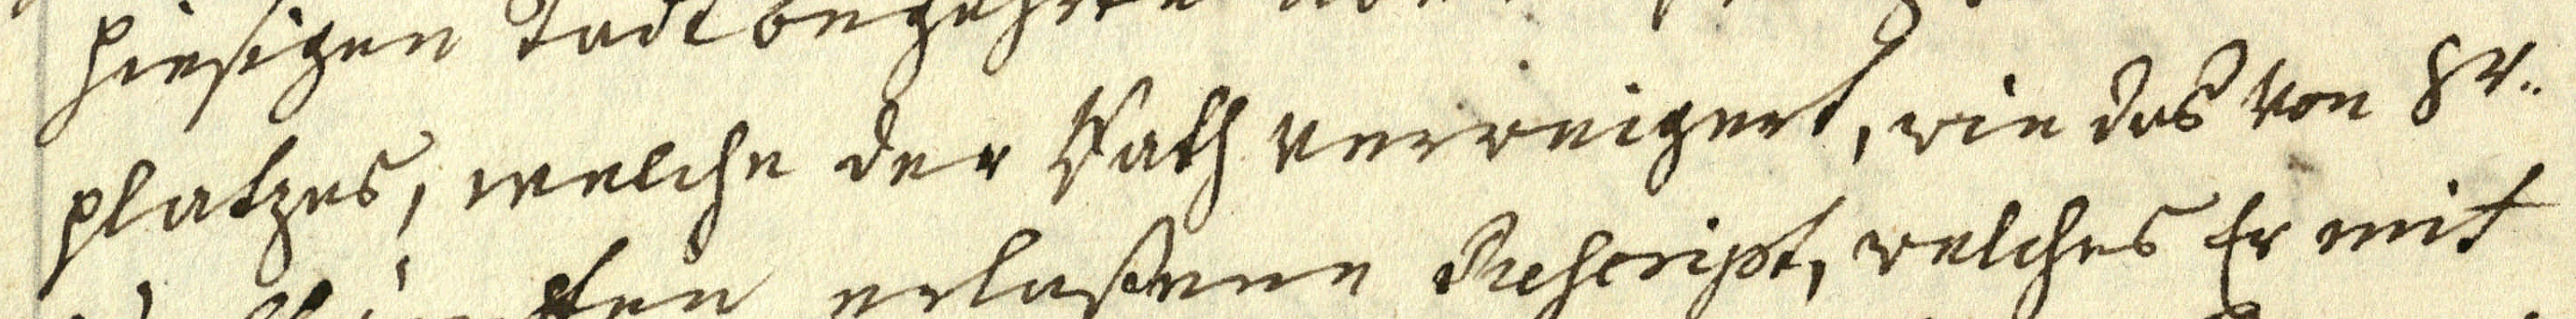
platzes, welche der Rath verweigert, wie das von Sr.
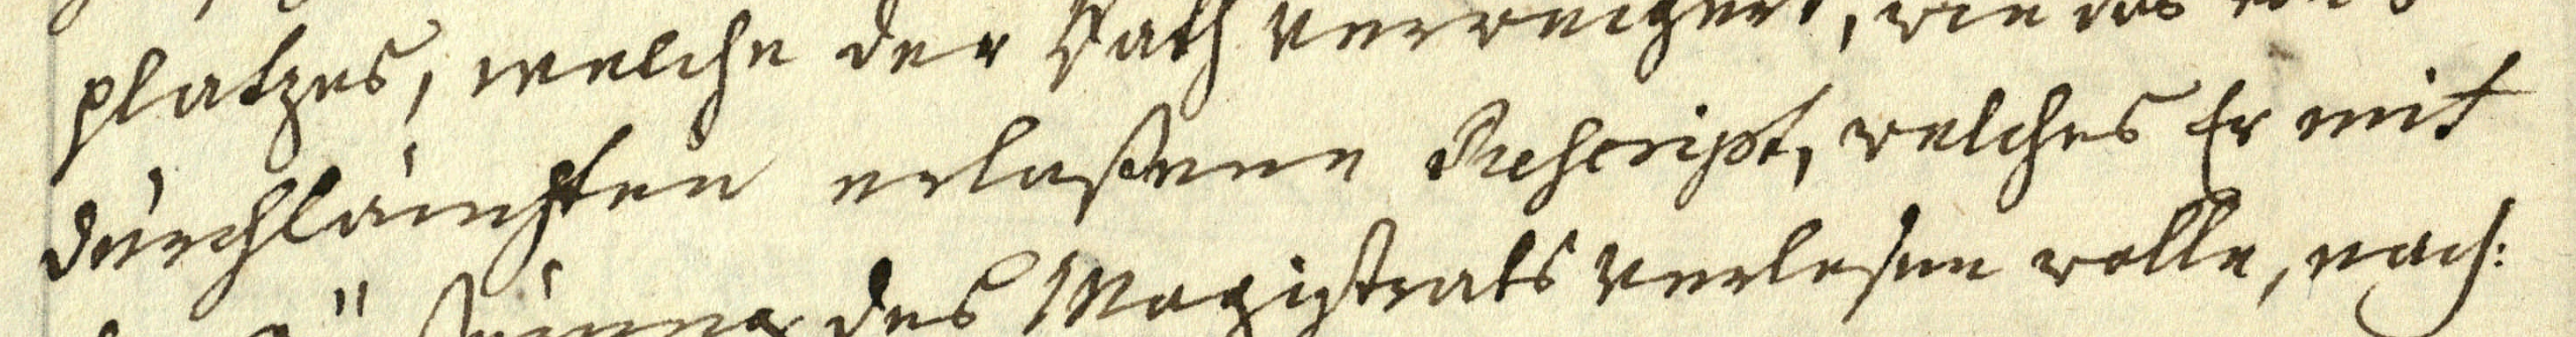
Durchlauchten erlaßene Rescript, welches Er mit
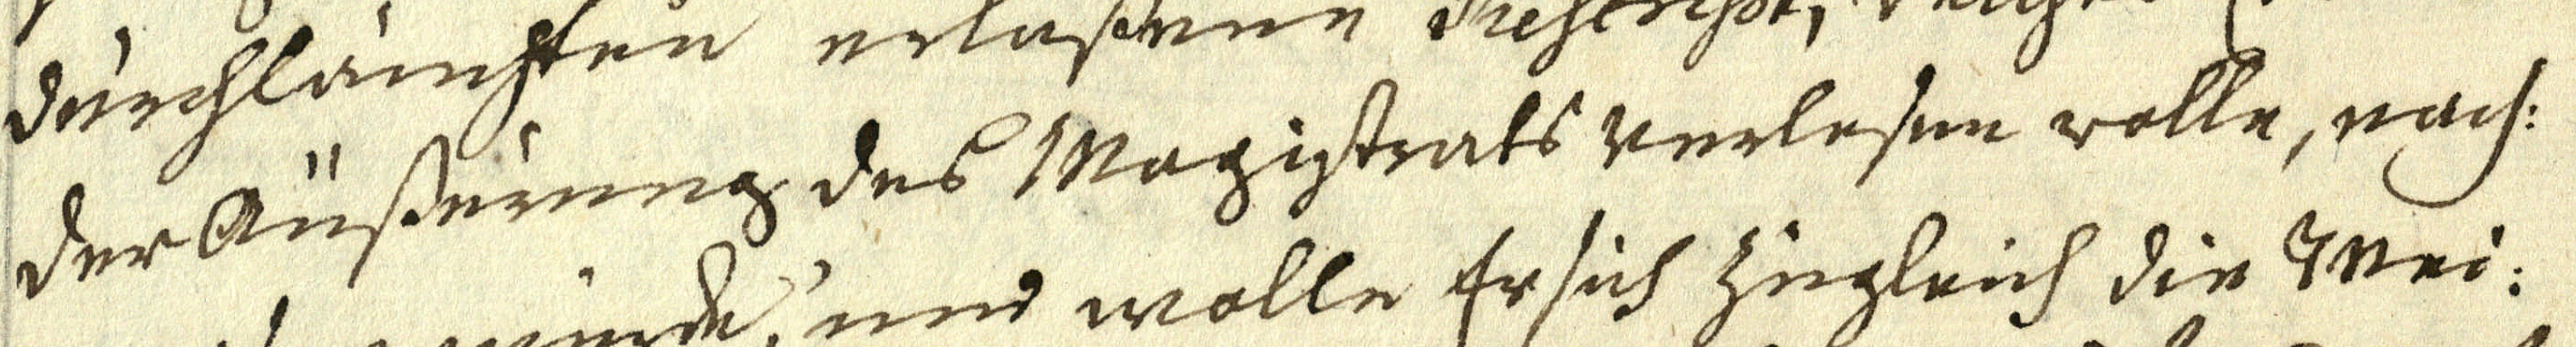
der Äußerung des Magistrats verlesen wolle, nach¬
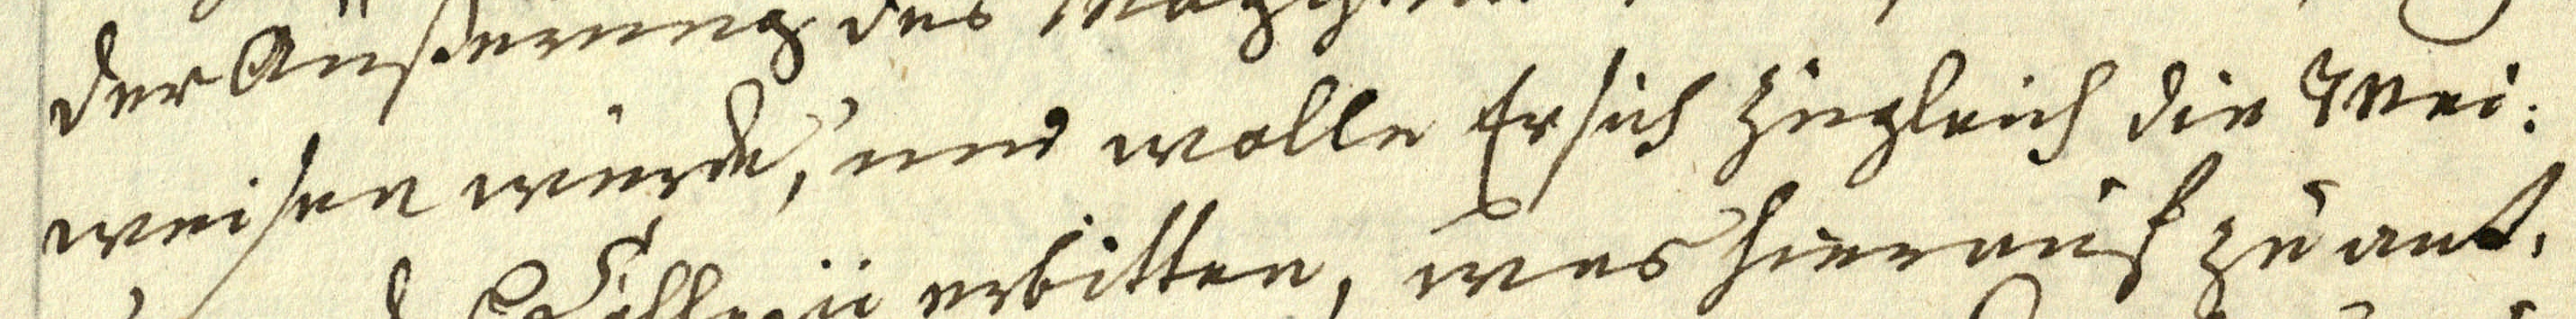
weisen würde, und wolle Er sich zugleich die Mei¬
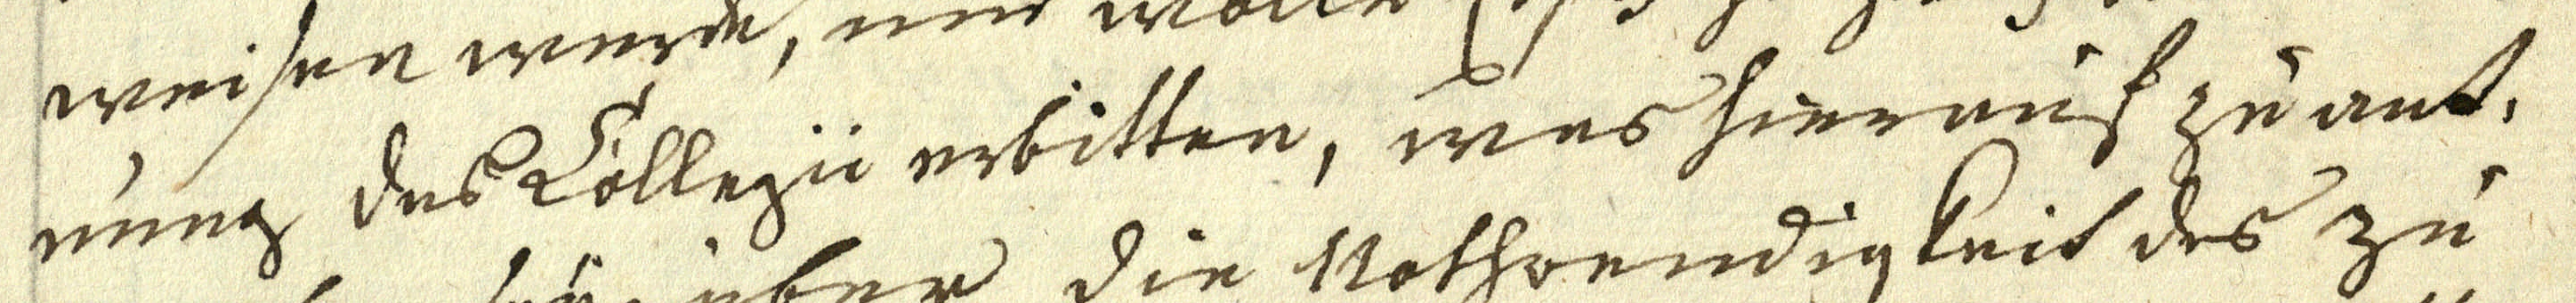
nung des Collegii erbitten, was hierauf zu ant¬
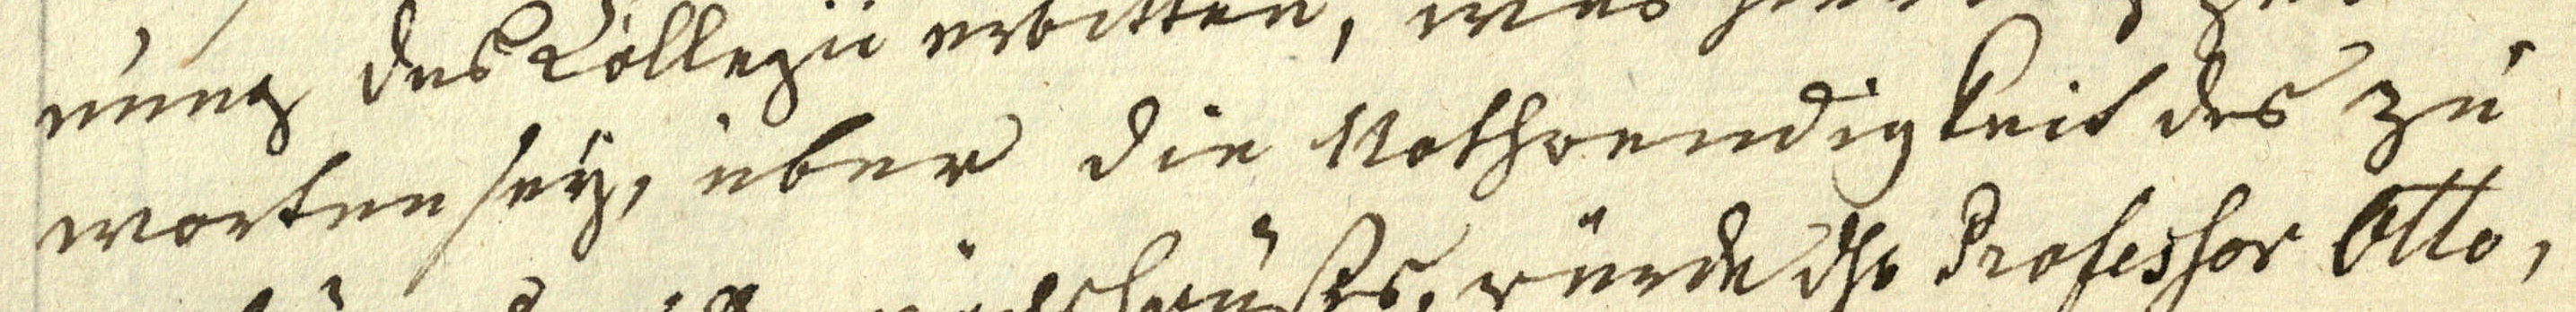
worten seÿ, über die Nothwendigkeit des zu
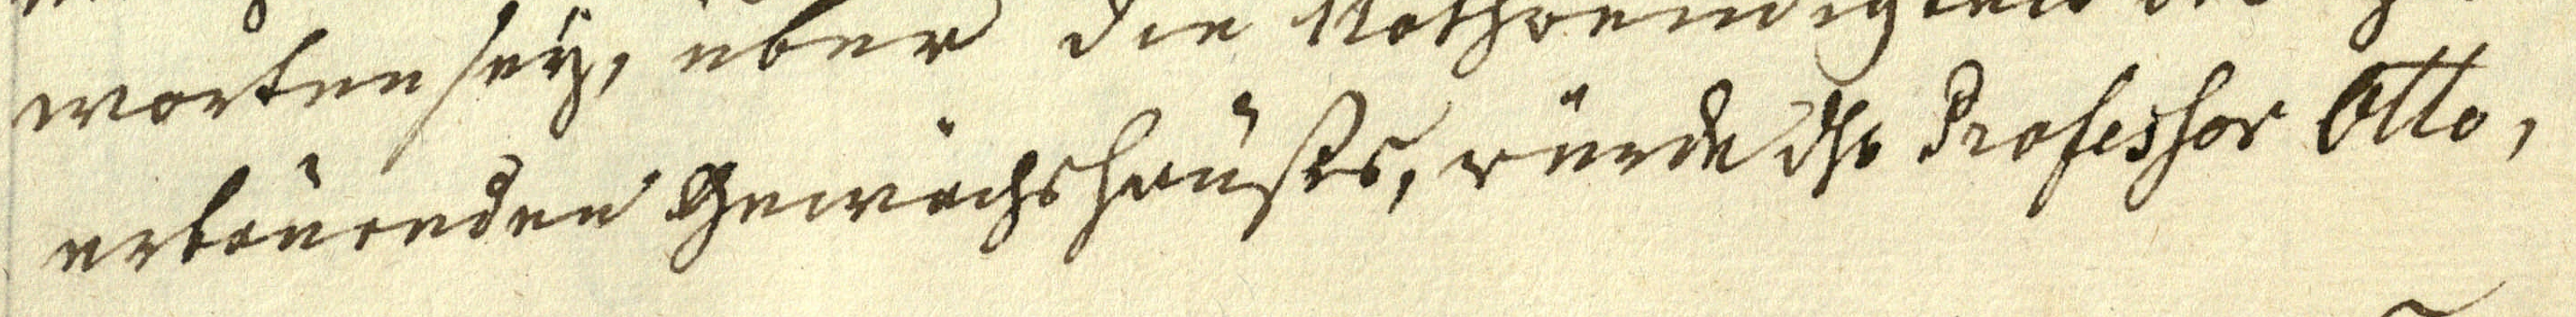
erbauenden Gewächshauses, würde dh Professor Otto,
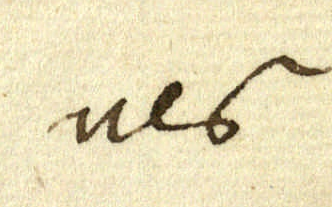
als
